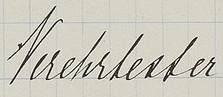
Verehrtester
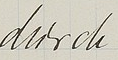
Herr und
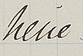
M. erhielt
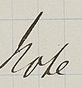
Herr
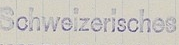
Bundesrath den Bescheid,
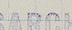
dass er nicht
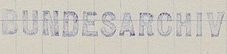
angemessen erachte
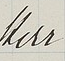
Note zu
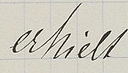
schicken;
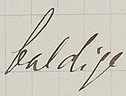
baldige
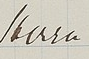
ersuche
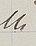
dahin
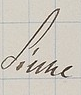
dem
